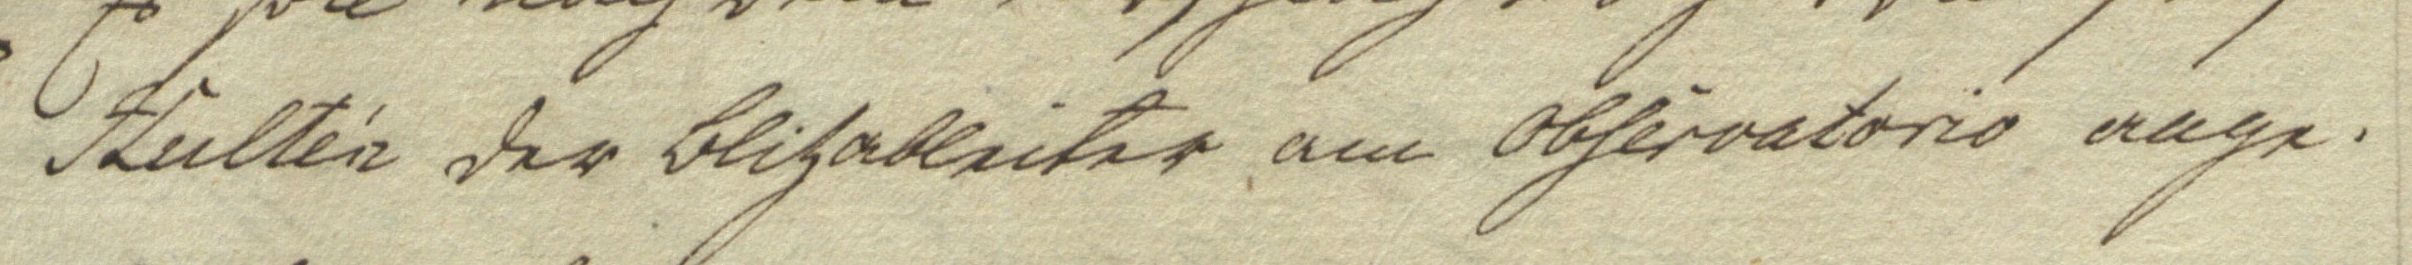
Hultén der Blizableiter am observatorio ange¬
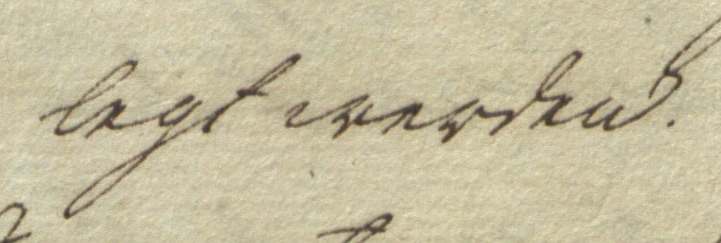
legt werden.
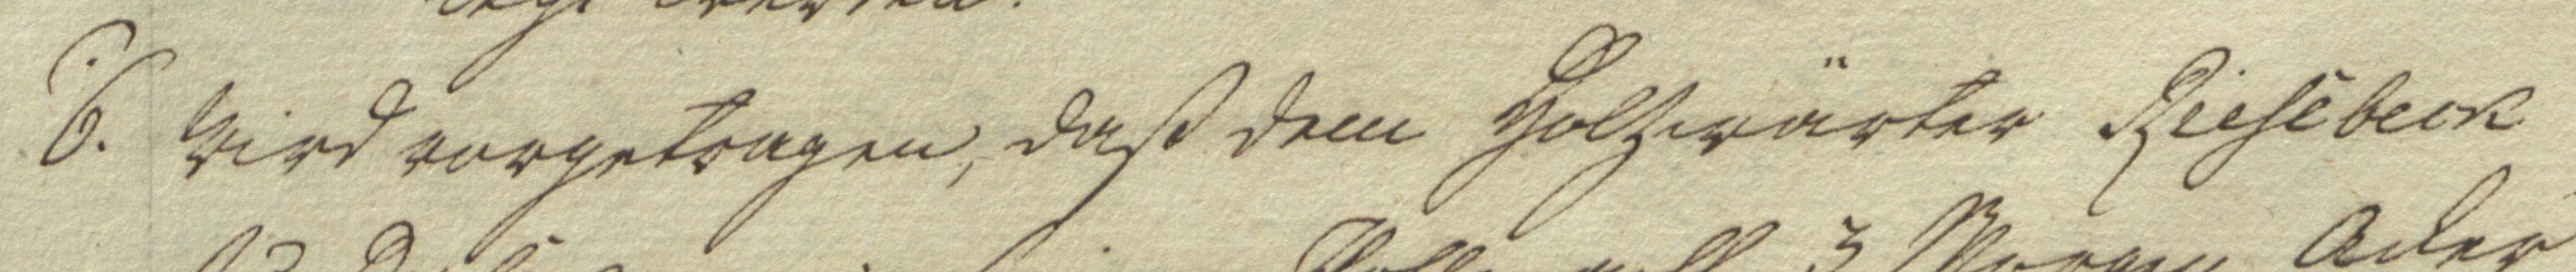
6. Wird vorgetragen, daß dem Holzwärter Riesebeck
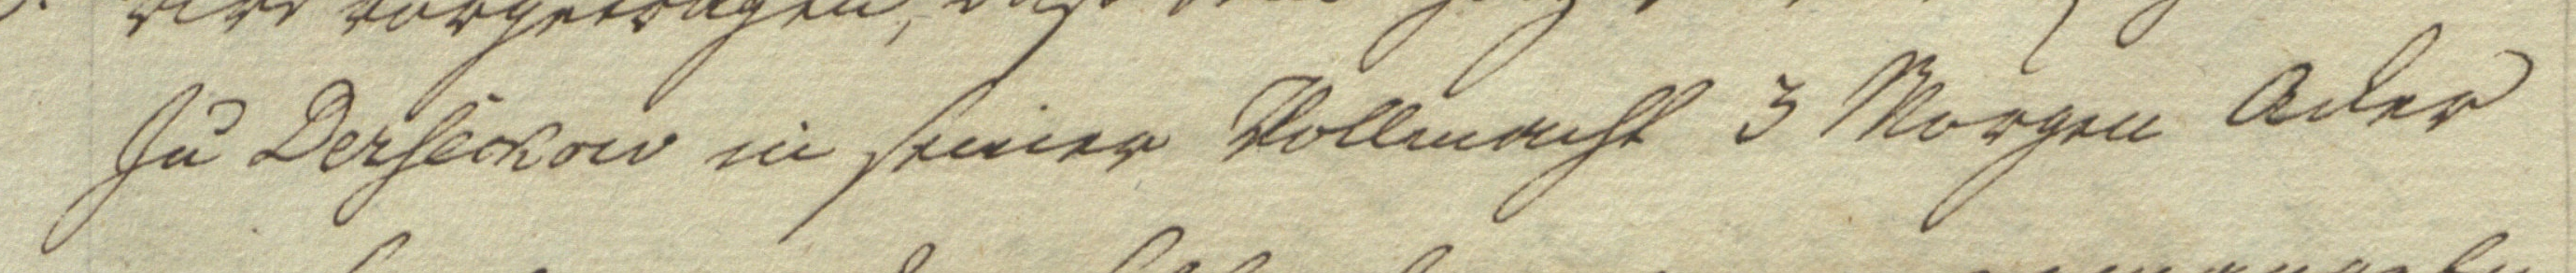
zu Derseckow in seiner Vollmacht 3 Morgen Acker
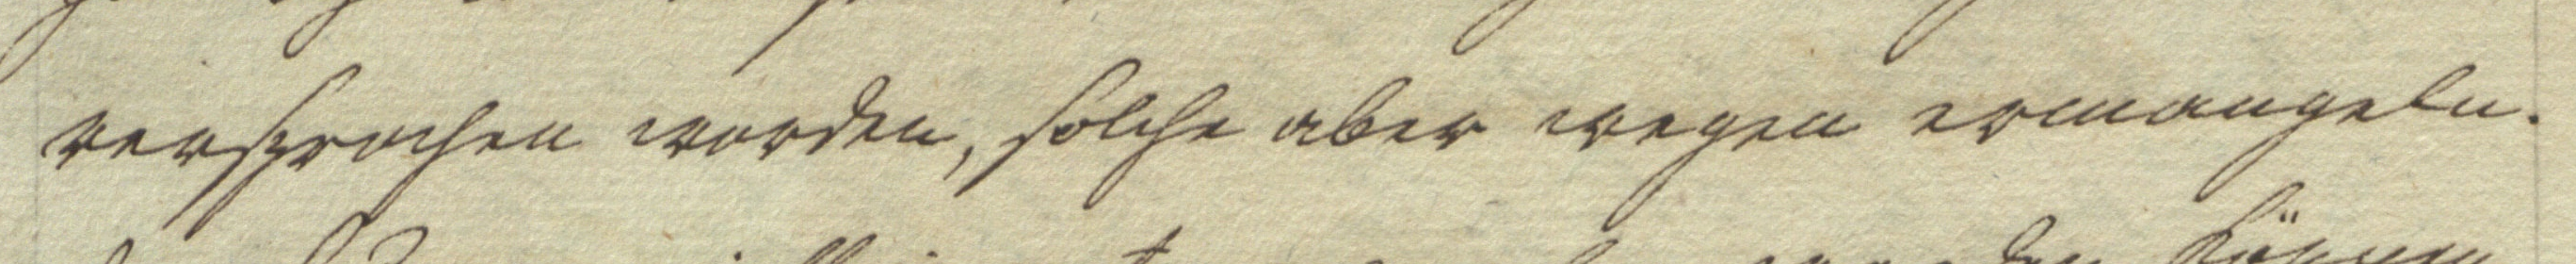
versprochen worden, solche aber wegen ermangeln¬
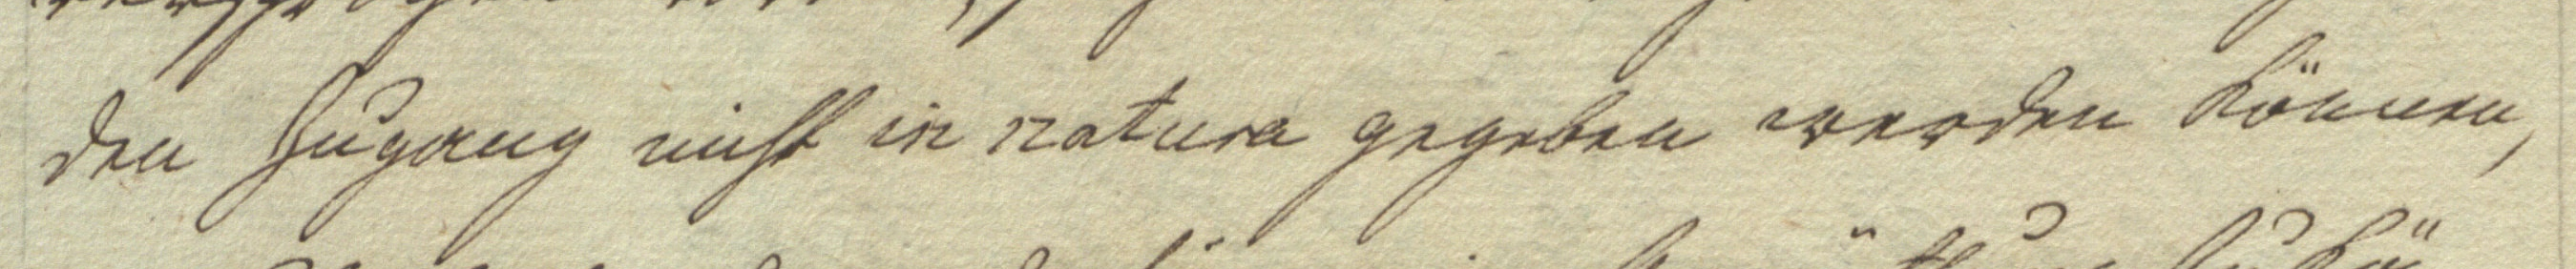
den Zugang nicht in natura gegeben werden können,
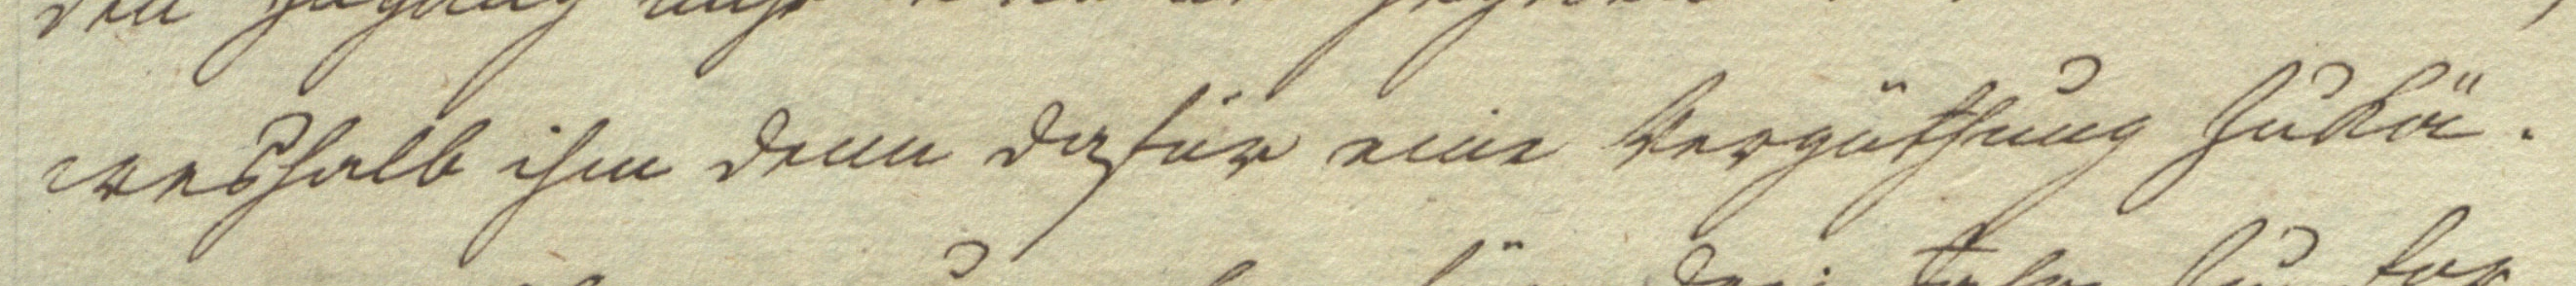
weshalb ihm denn dafür eine Vergüthung zukä¬
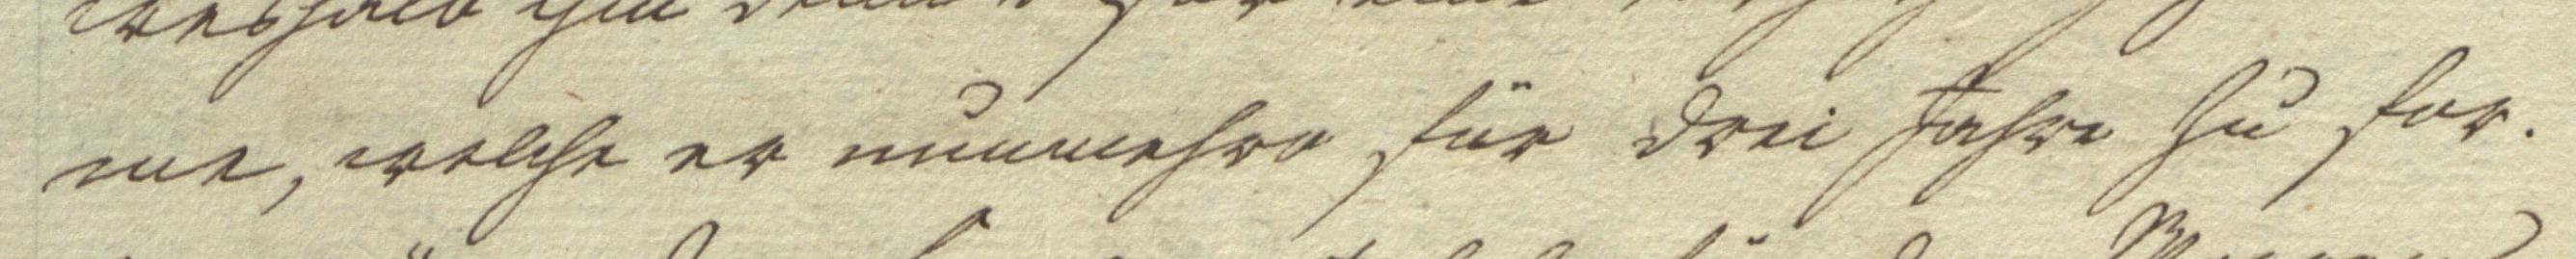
me, welche er nunmehro für drei Jahre zu for¬
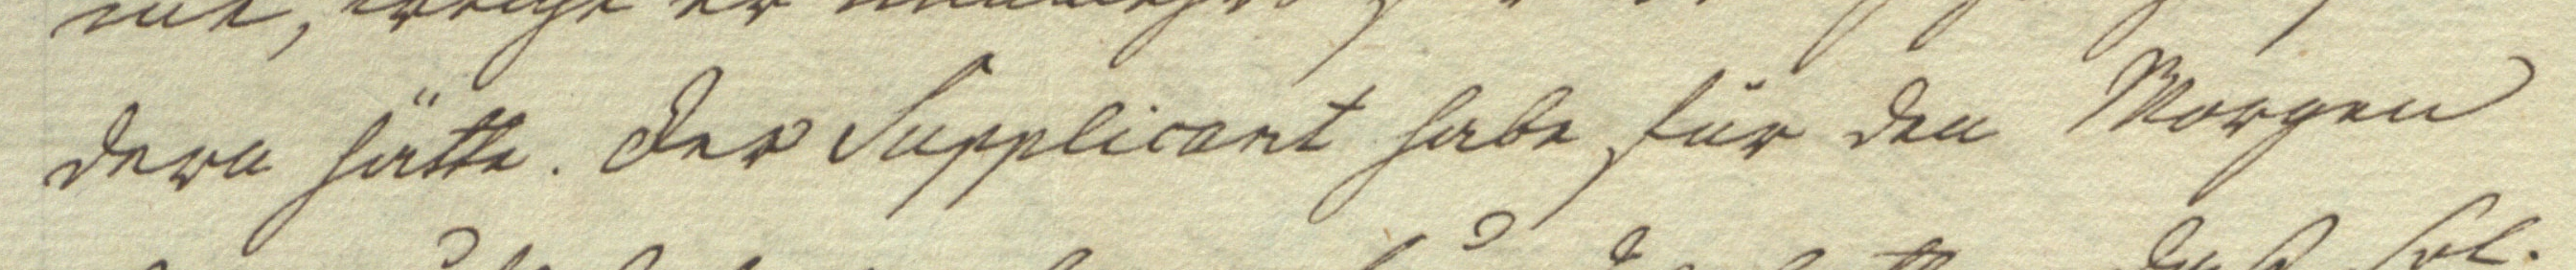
dern hätte. Der Supplicant habe für den Morgen
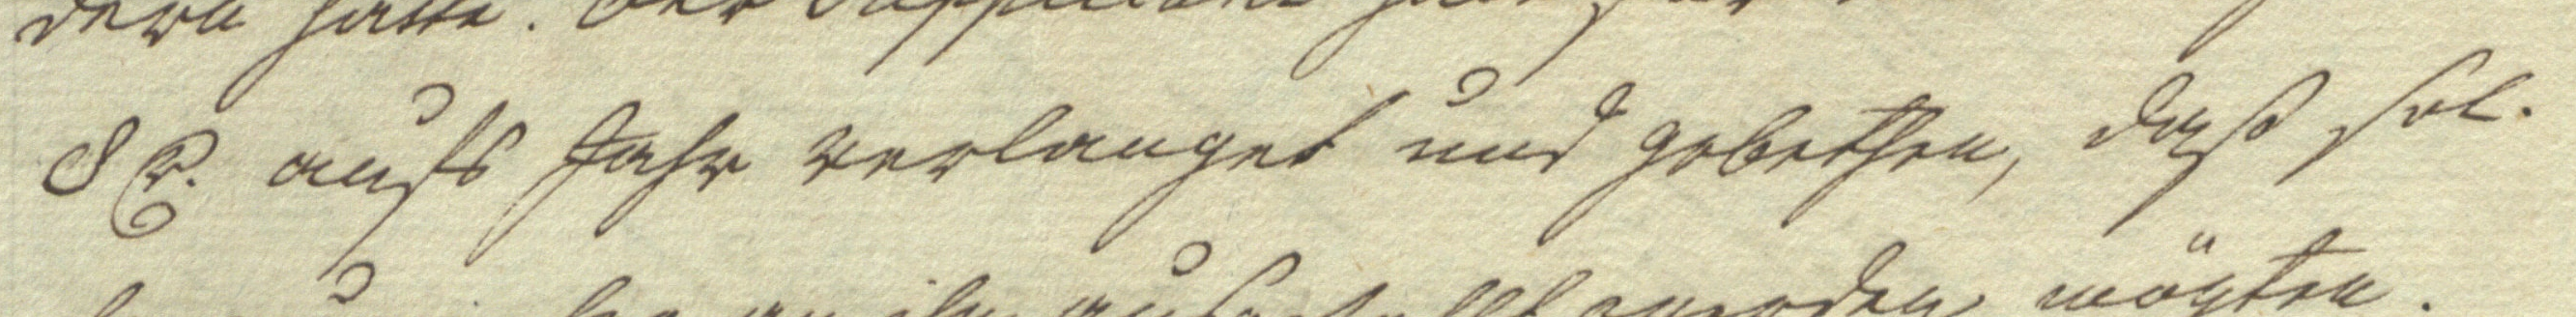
8 l. aufs Jahr verlanget und gebethen, daß sol¬
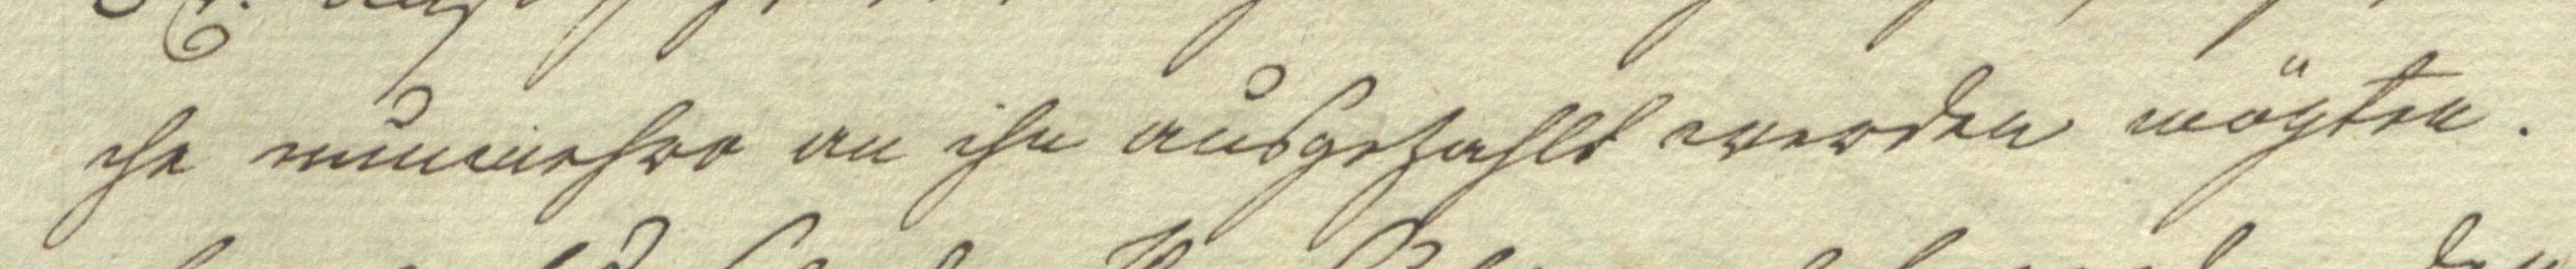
che nunmehro an ihn ausgezahlt werden mögten.
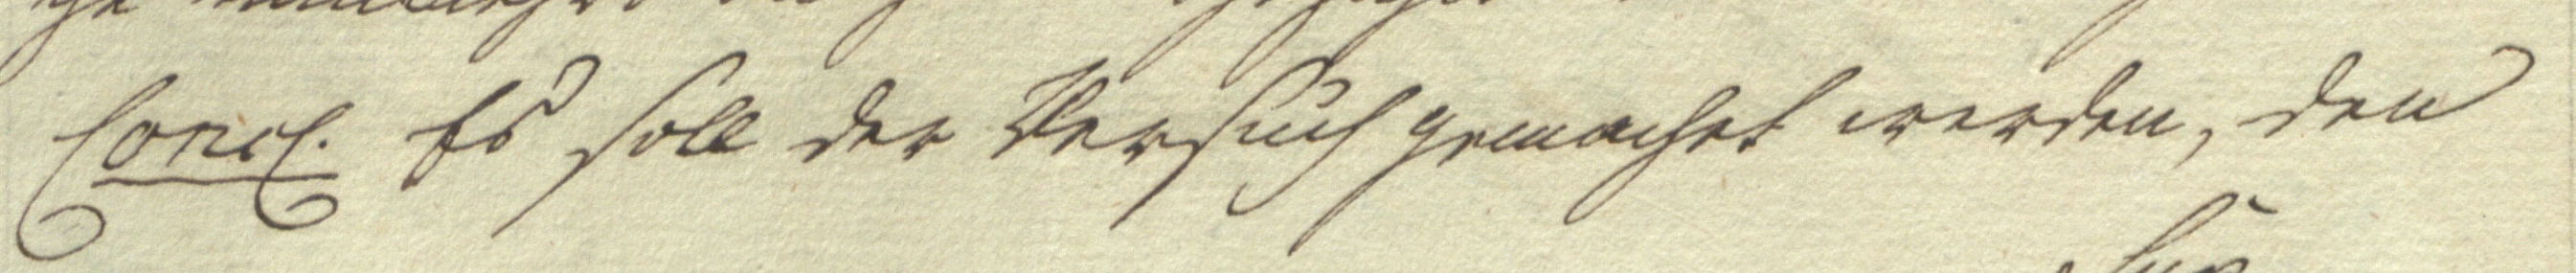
Concl. Es soll der Versuch gemachet werden, den
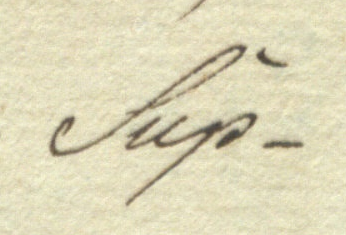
Sup¬
